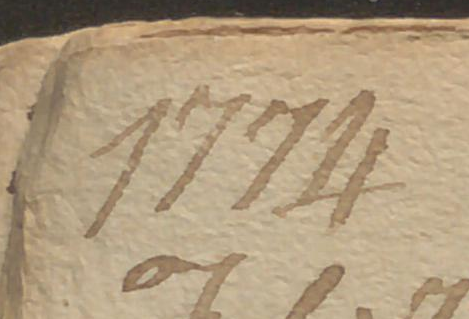1774
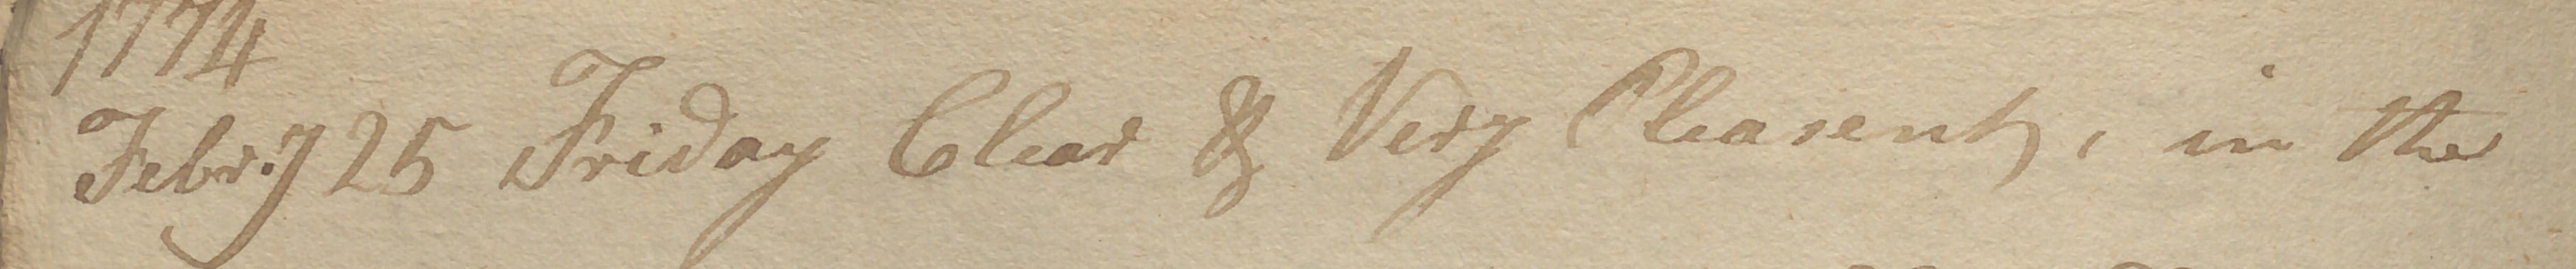Febr^y. 25 Friday Clear & Very Pleasent, in the
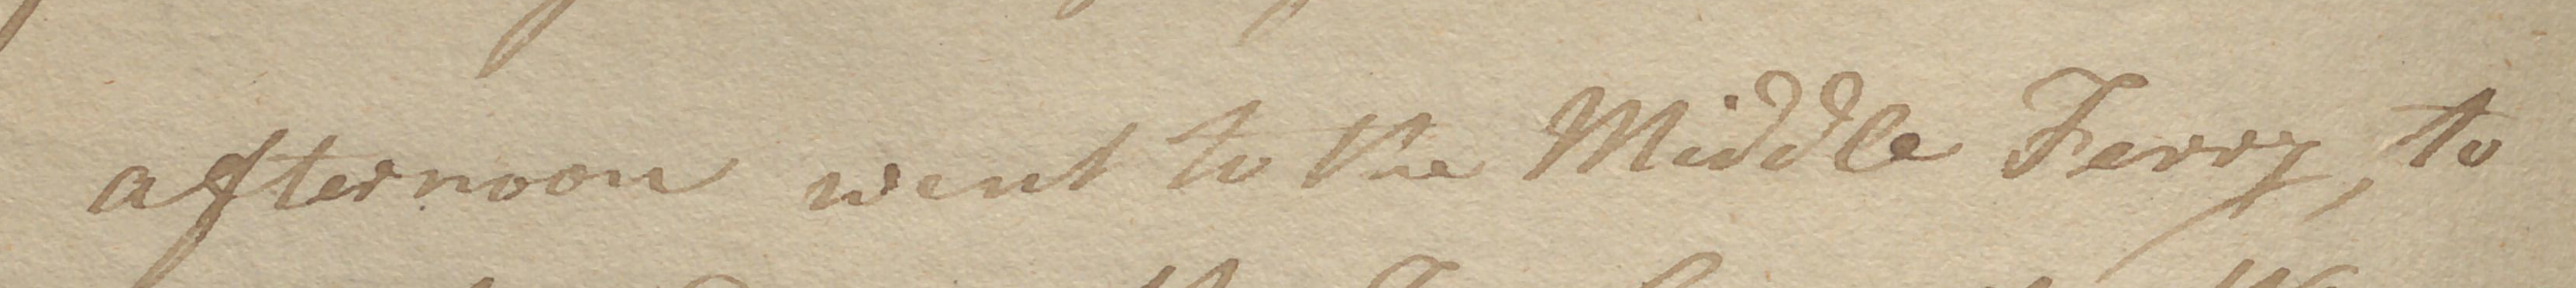afternoon went to the Middle Ferry to
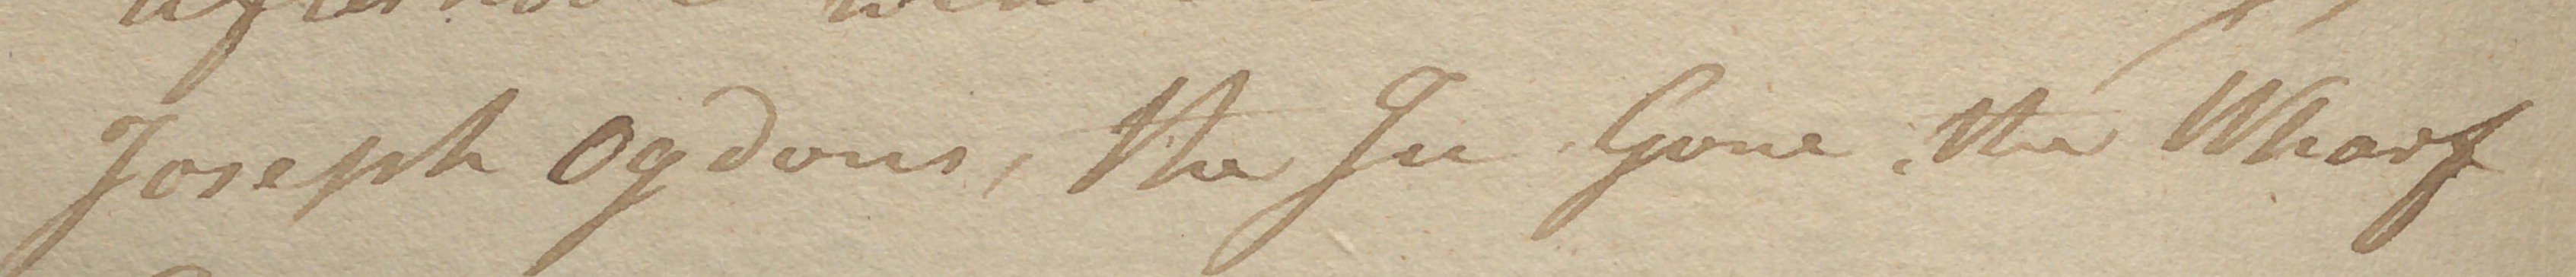Joseph Ogdons, the Ice Gone the Wharf
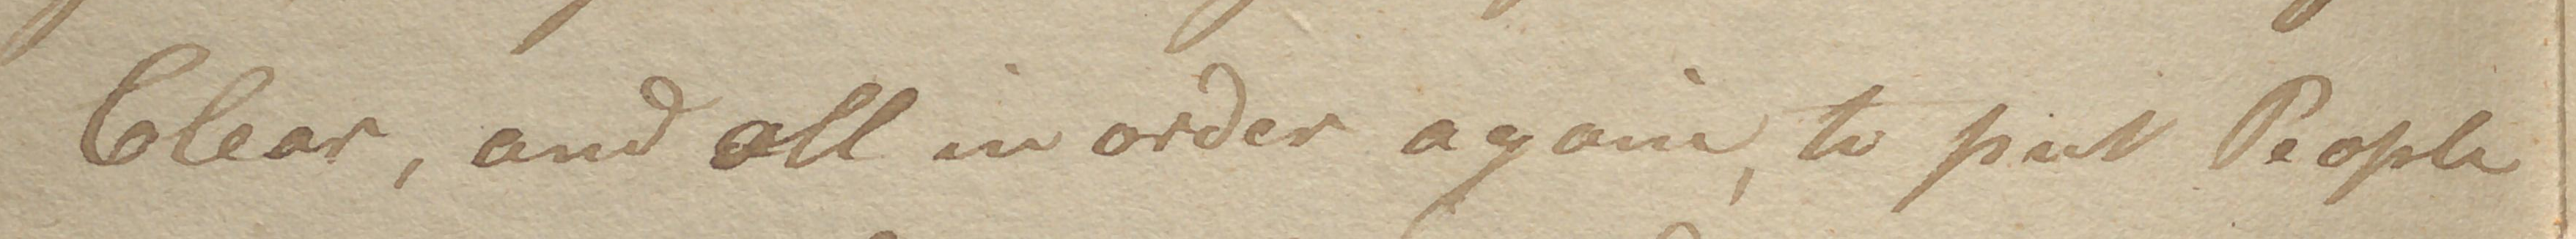Clear, and all in order again to put People
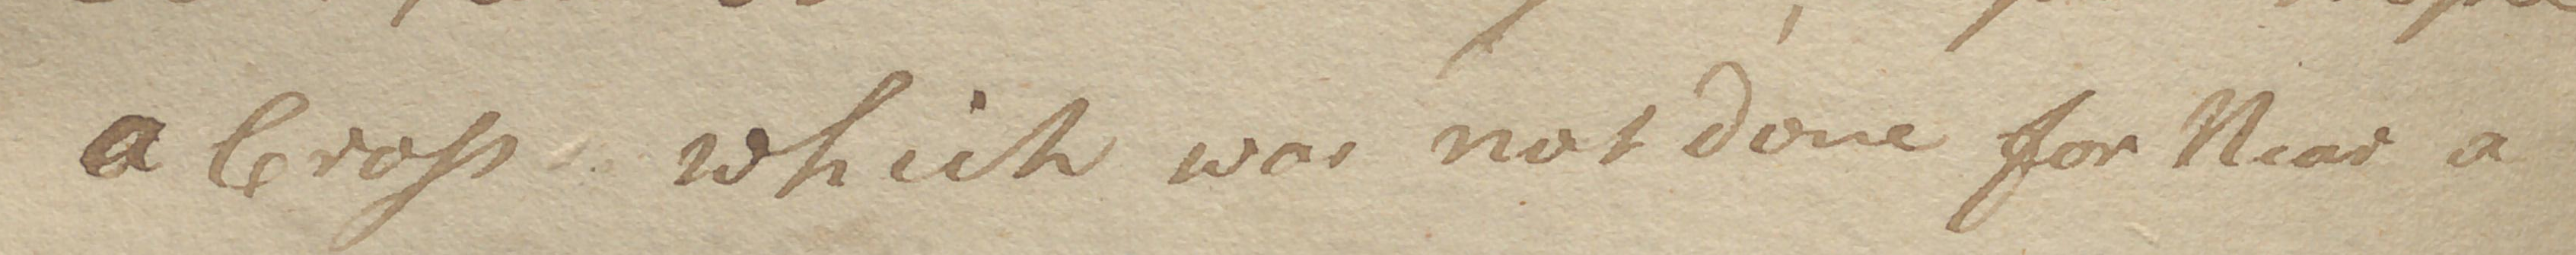A Cross which was not done for Near a
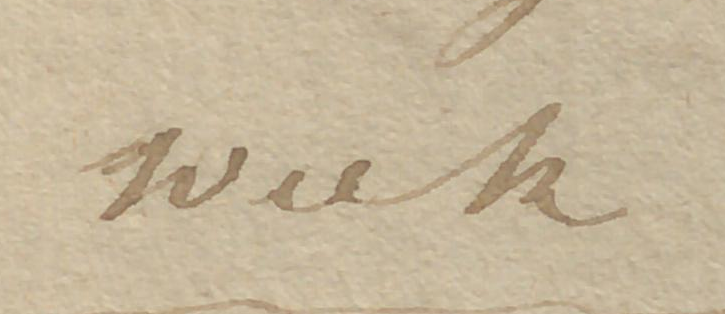week
